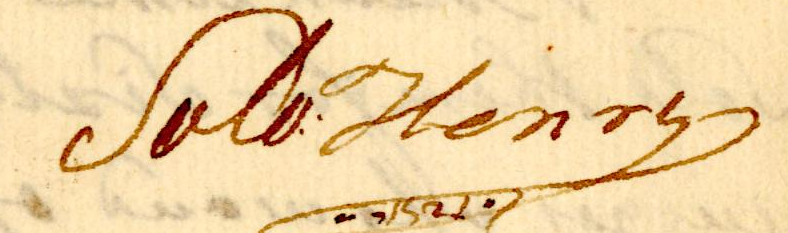Solo: Henry
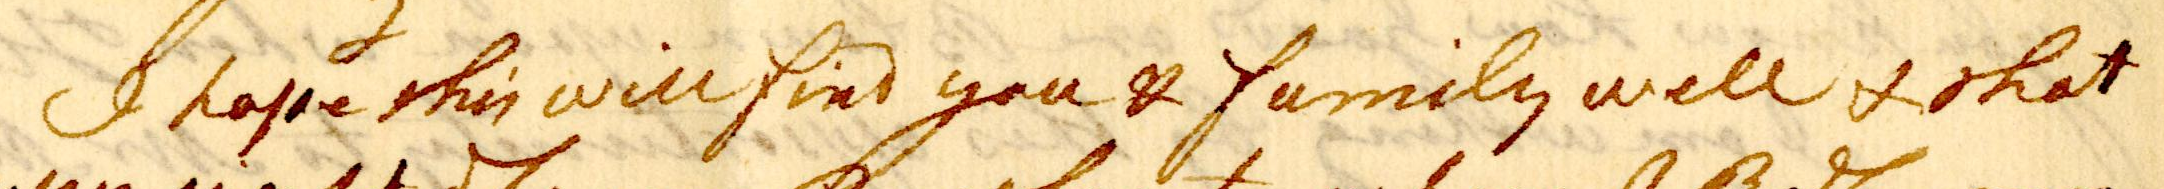I hope this will find you & family well & that
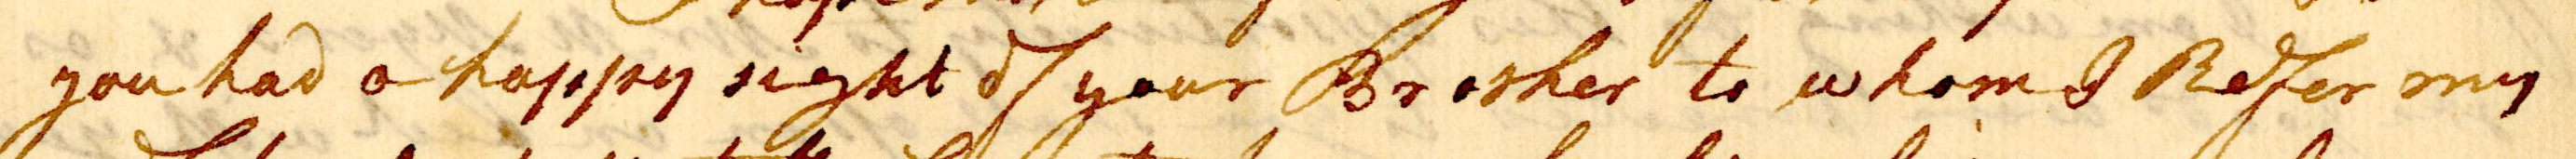you had a happy sight of your Brother to whom I Refer my
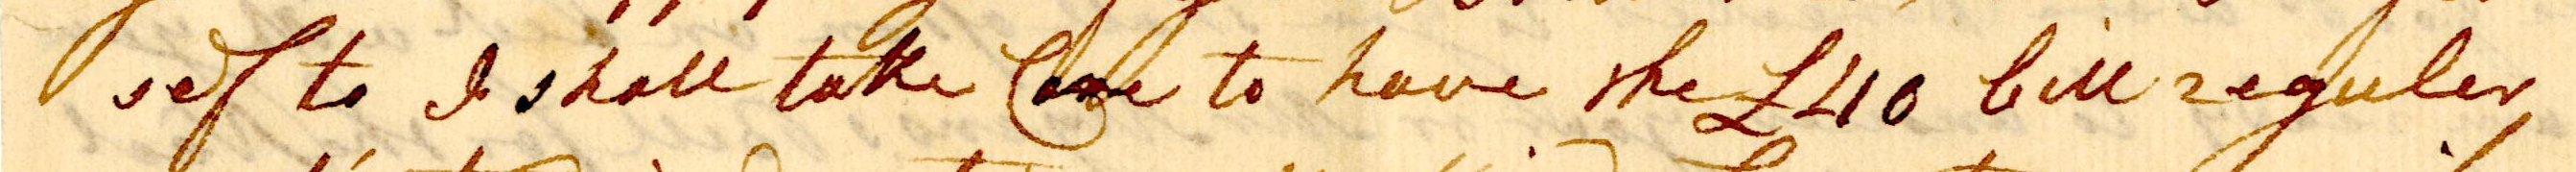self to I shall take one to have the £40 bill reguler,
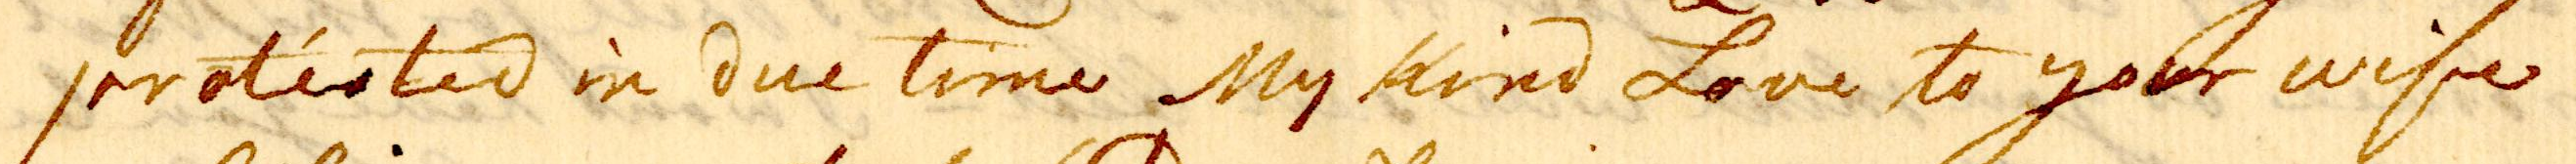protested in due time My kind Love to your wife
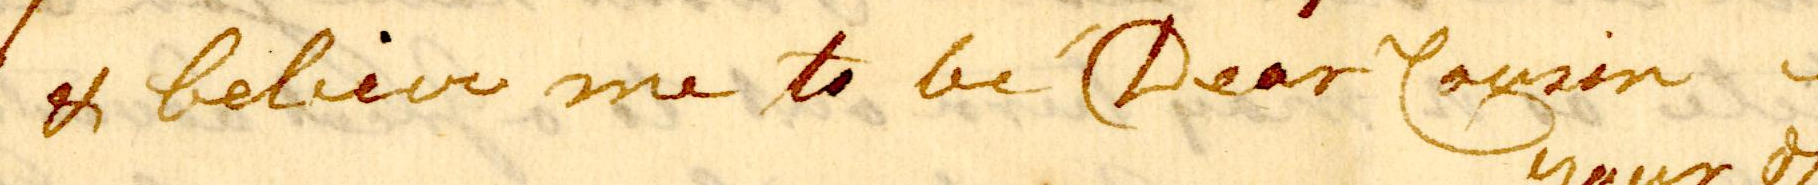& believe me to be Dear Cousin-
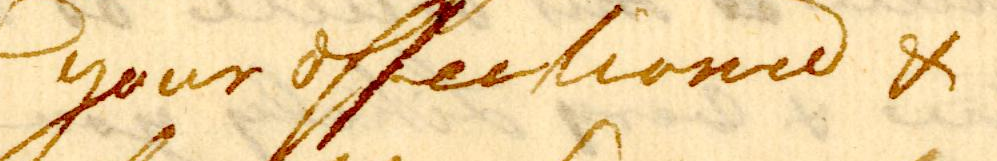your Affectioned &
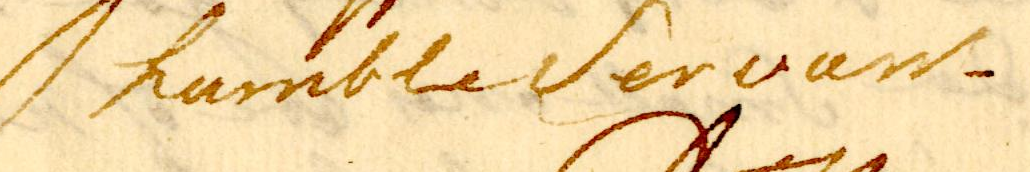humble Servant
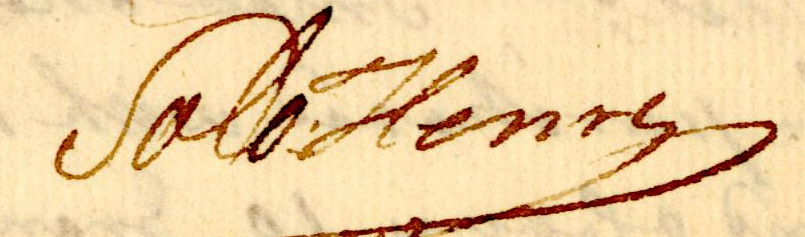Solo^n Henry
